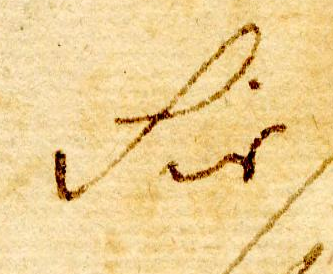Sir
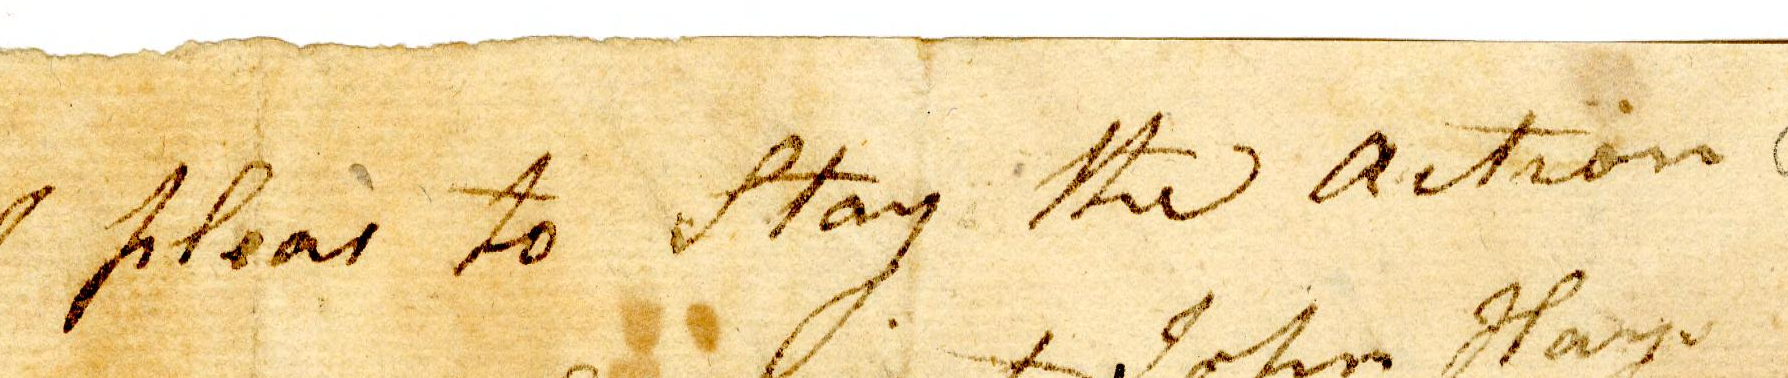pleas to Stay the action
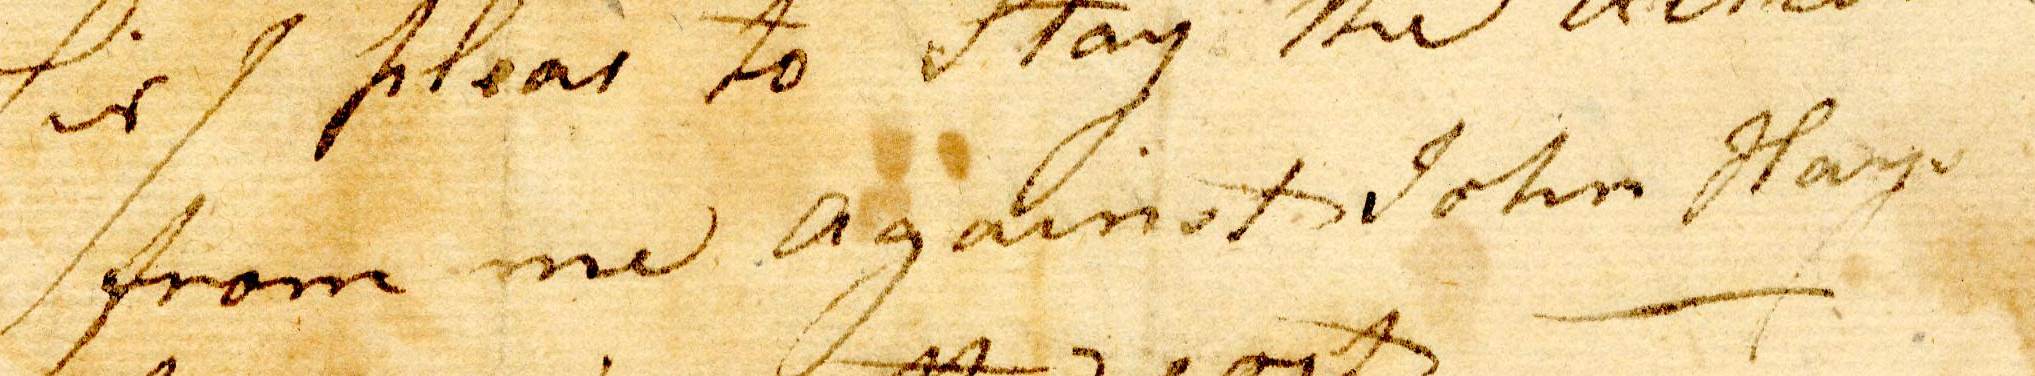from me Against John Hays
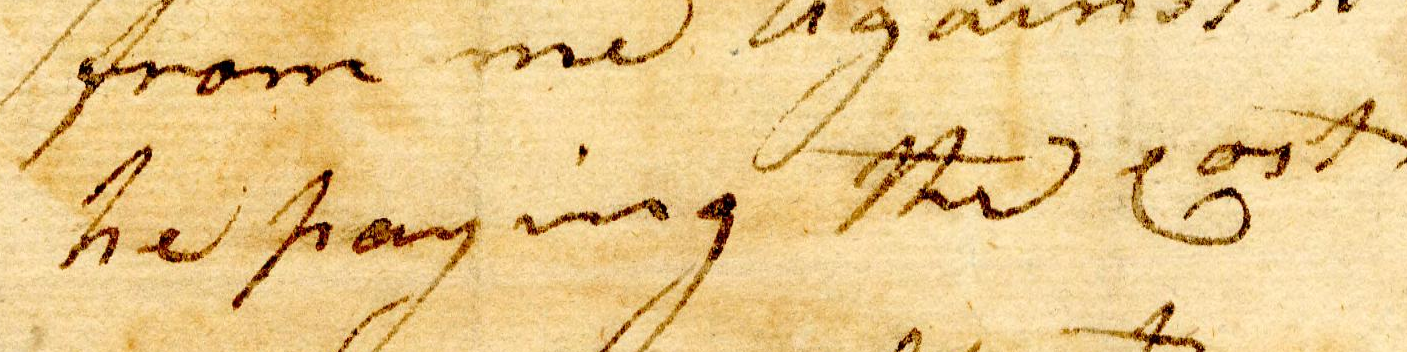he paying the Cost
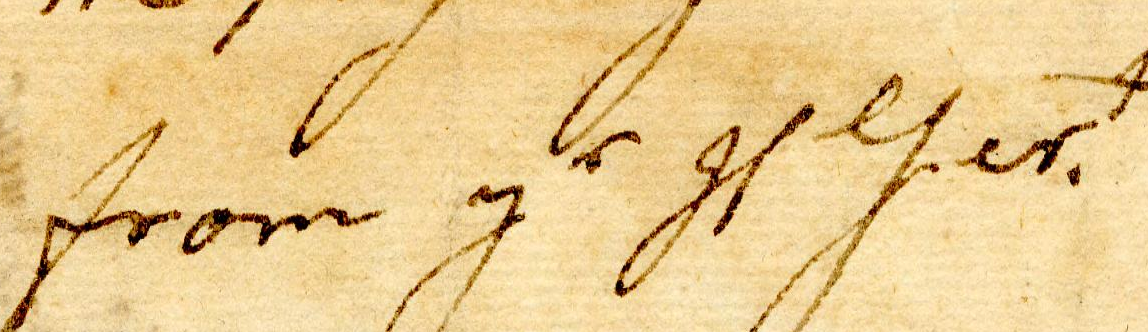from y^r H^e Ser^t.
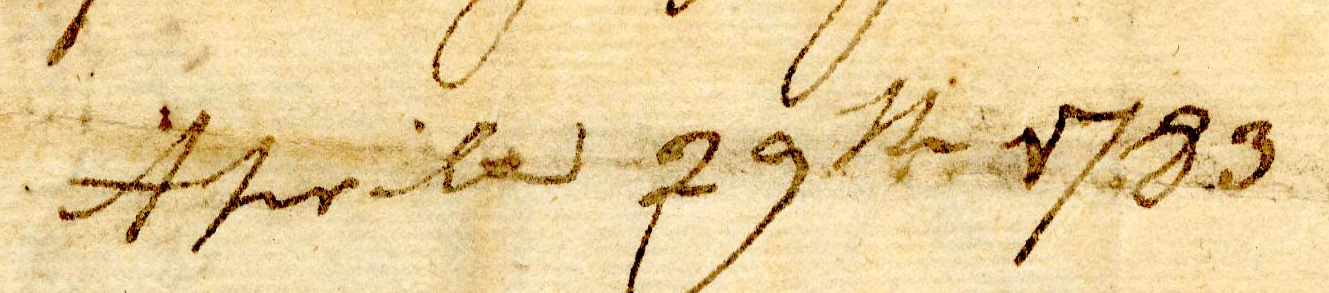April 29th 1783
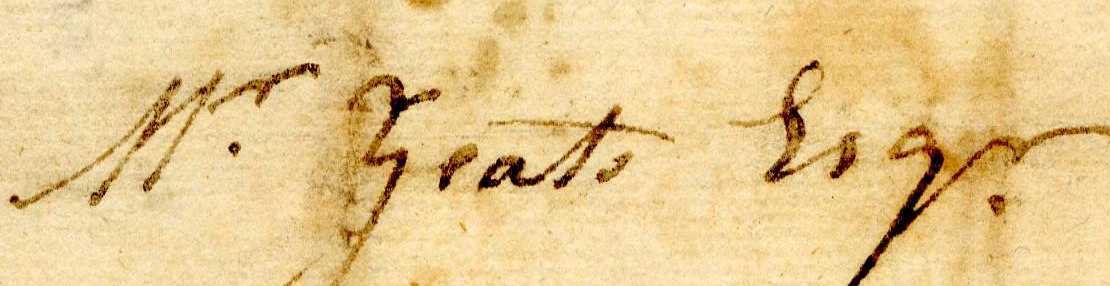M^r. Yeats Esqr.
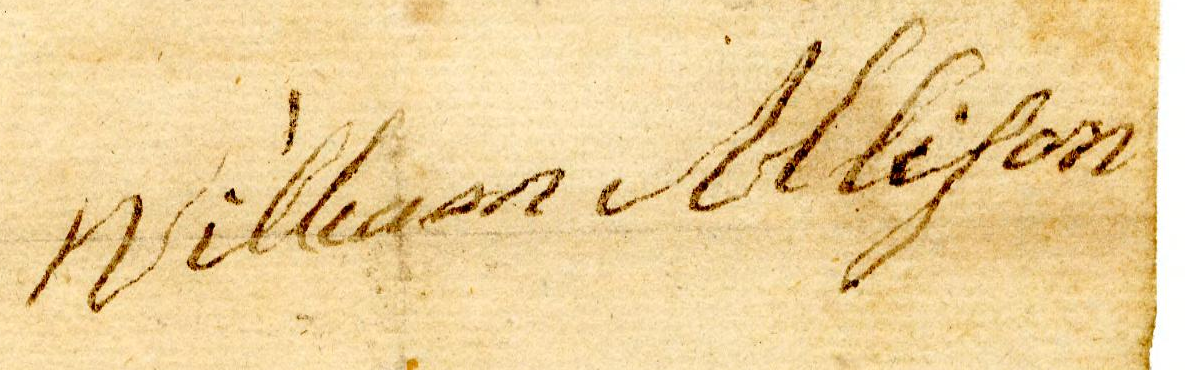William Allison
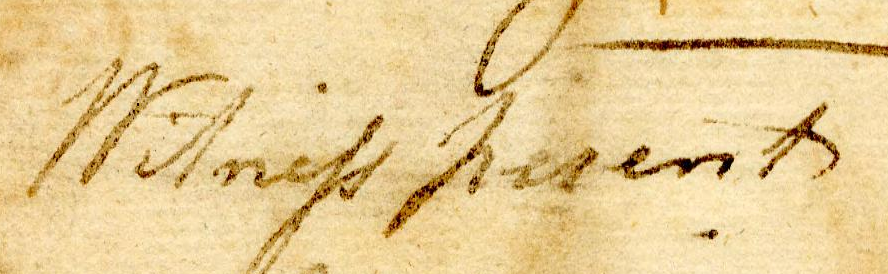Witness present
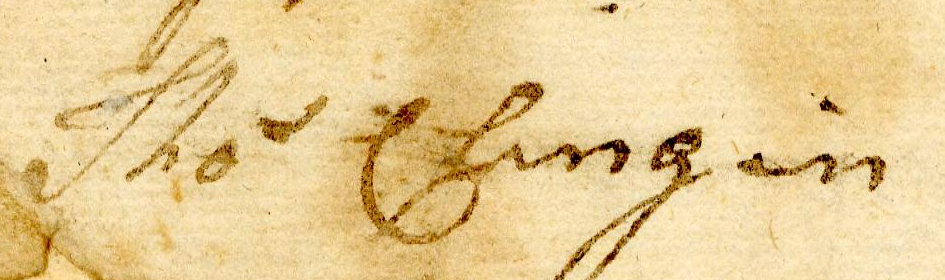Tho^s Clingin
